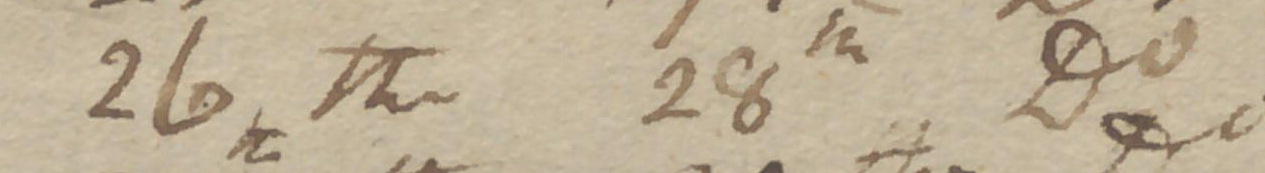26 the 28^th D^o
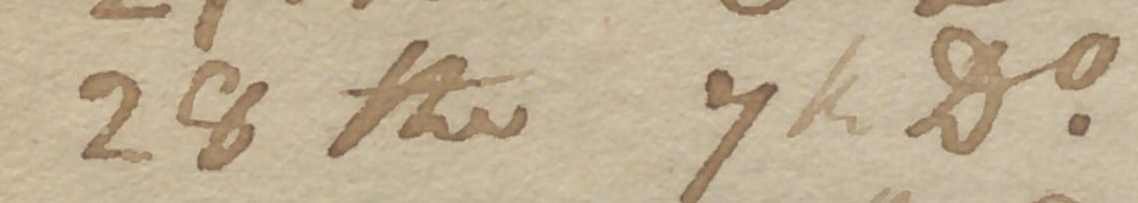28 the 7^th D^o.
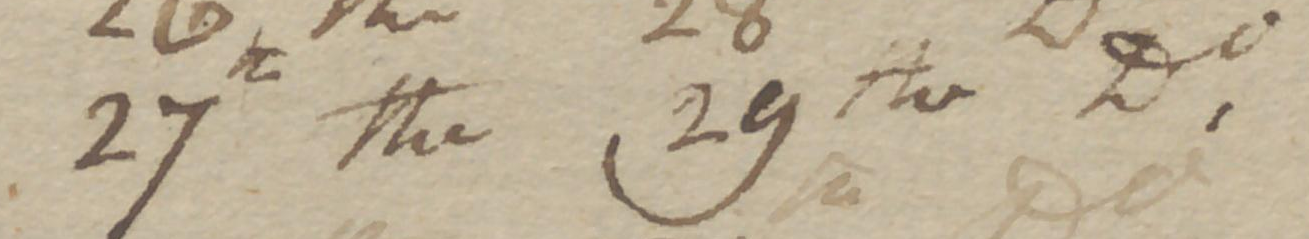27 the 29^th D^o.
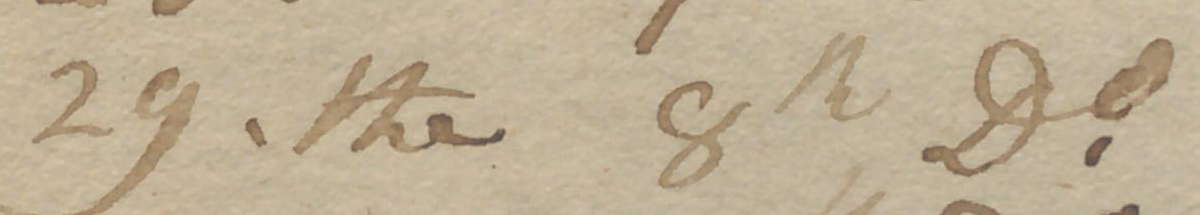29. the 8^th D^o.
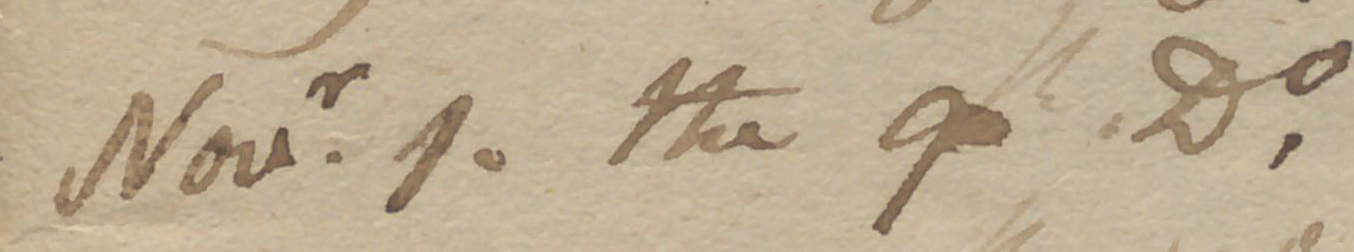Nov^r. 1. the 9^th. D^o.
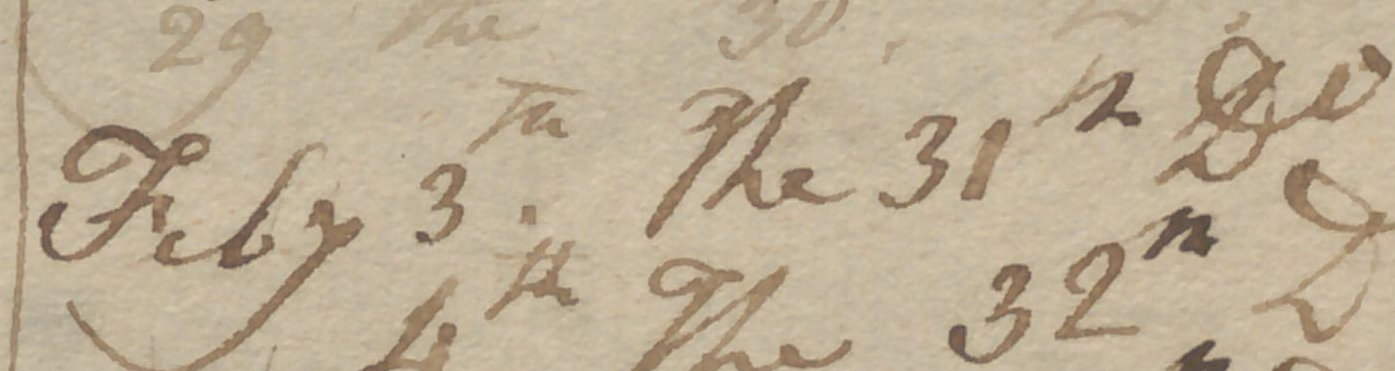Feby 3^th. the 31^th D^o.
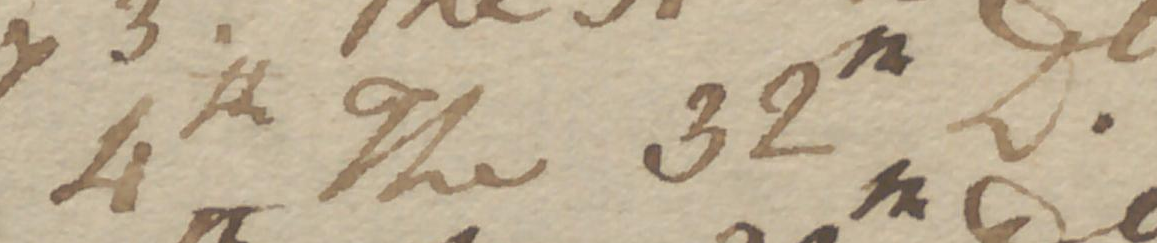4^th The 32^th D^o.
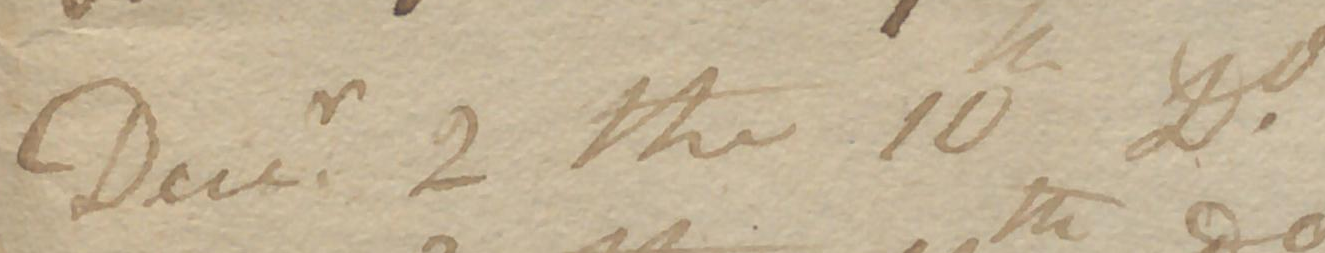Dec^r. 2 the 10^th D^o.
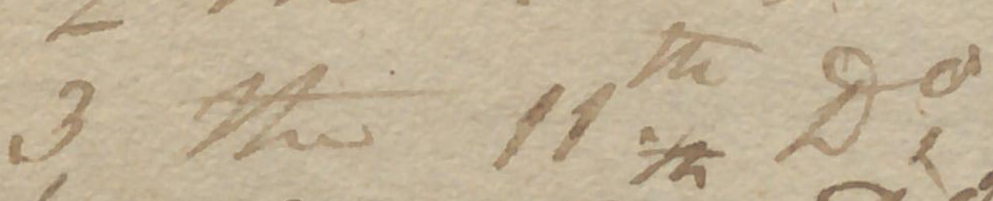3 the 11^th D^o.
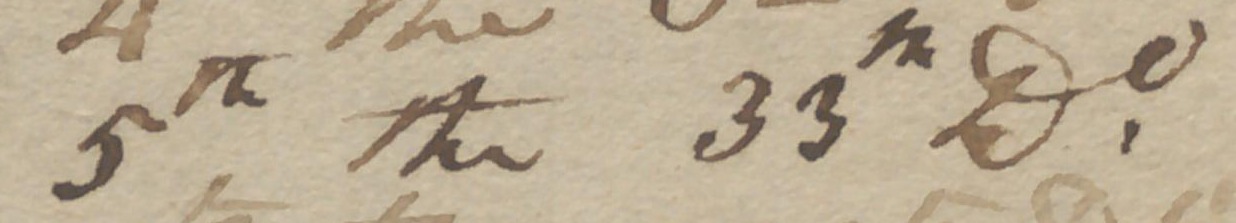5^th the 33^th D^o.
